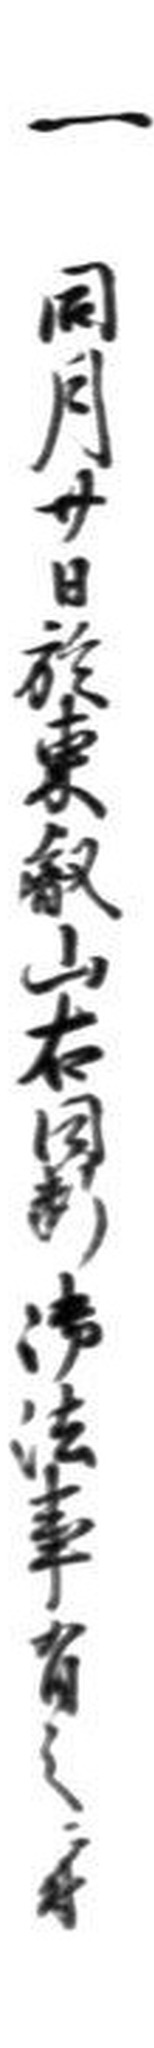一同月廿日於東叡山右同断御法事有之ニ付
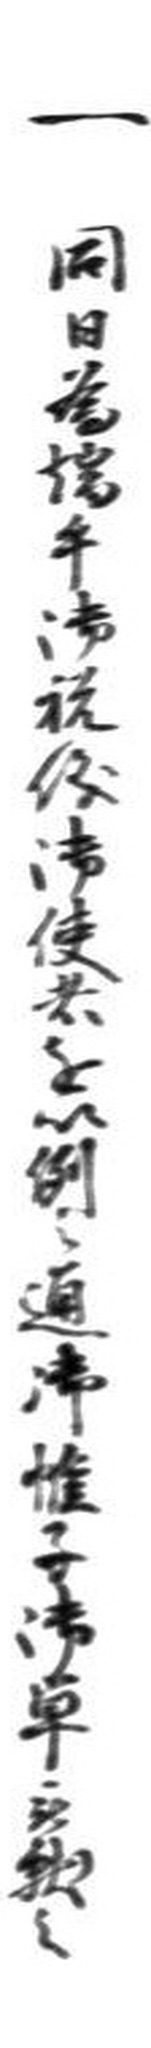一同日為端午御祝儀御使者を以例之通御帷子御単被献之
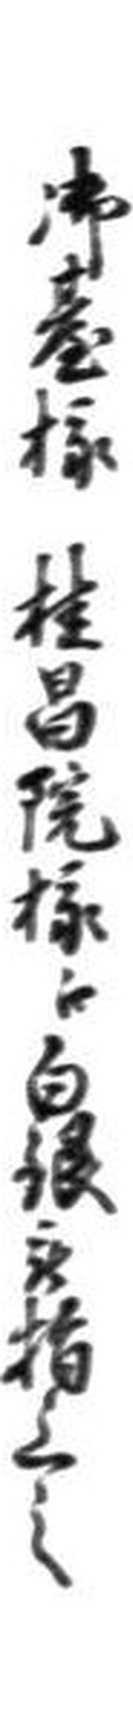御臺様桂昌院様江白銀被指上之
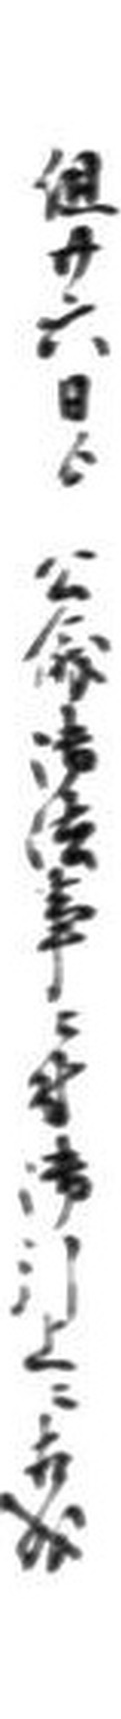但廿六日ゟ公儀御法事ニ付御引上ニ相成

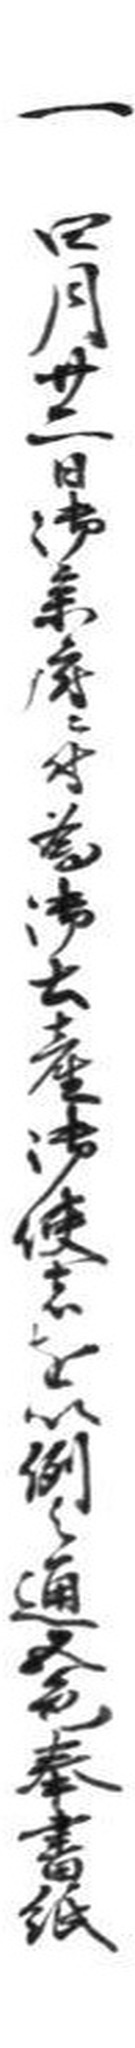一四月廿二日御参府ニ付為御土産御使者を以例之通五色奉書紙
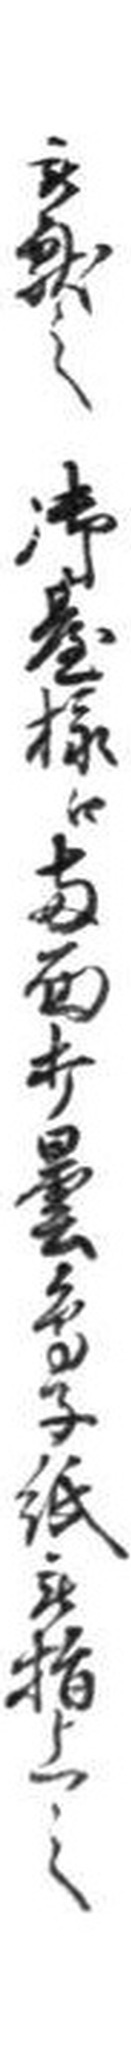被献之御臺様江両面打曇鳥子紙被指上之
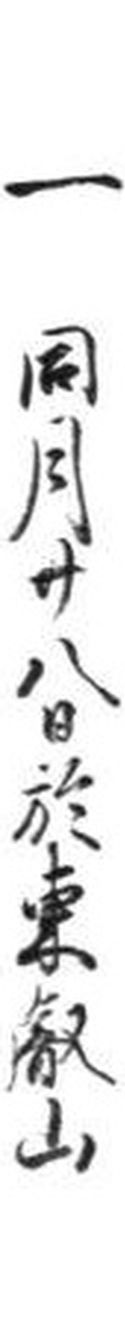一同月廿八日於東叡山
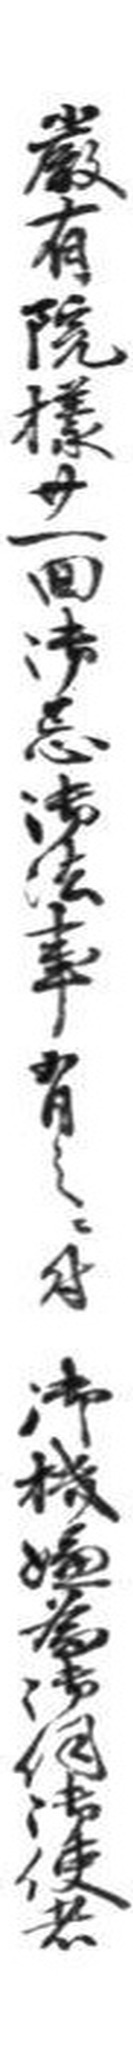厳有院様廿一回御忌御法事有之ニ付御機嫌為御伺御使者
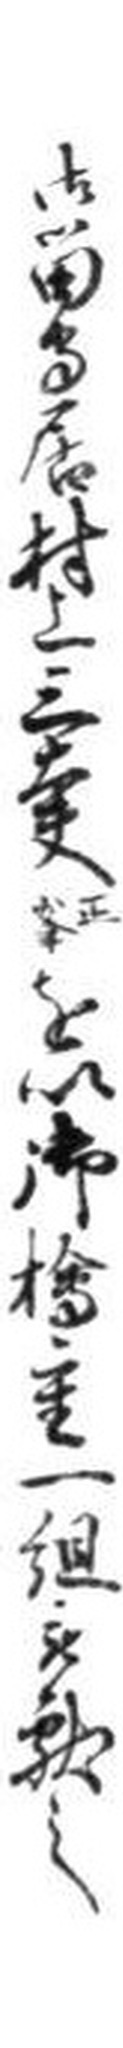御留守居村上三太夫正峰を以御桧重一組被献之
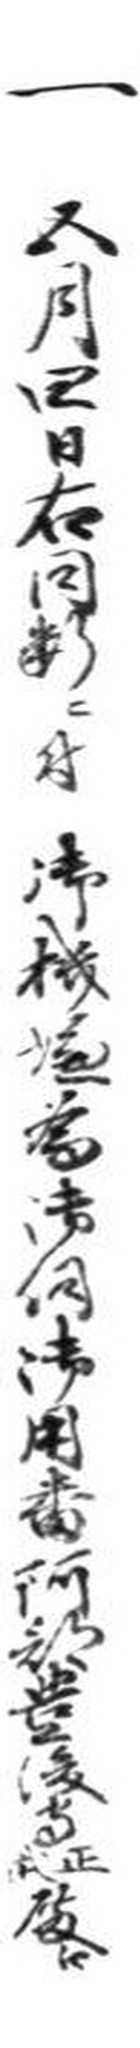一五月四日右同断ニ付御機嫌為御伺御用番阿部豊後守正武殿江
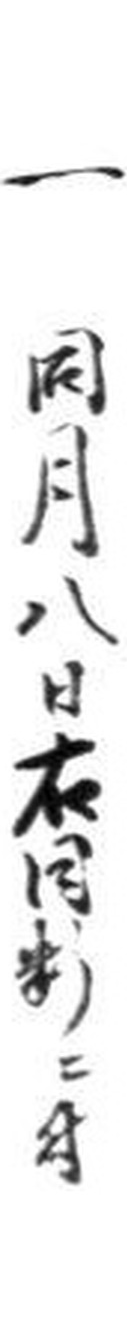一同月八日右同断ニ付
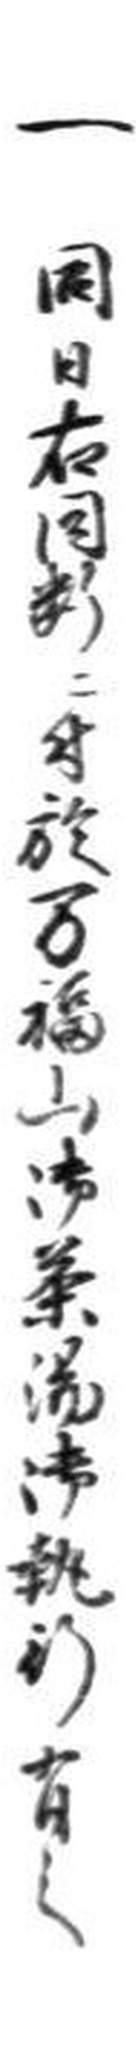一同日右同断ニ付於万福山御茶湯御執行有之
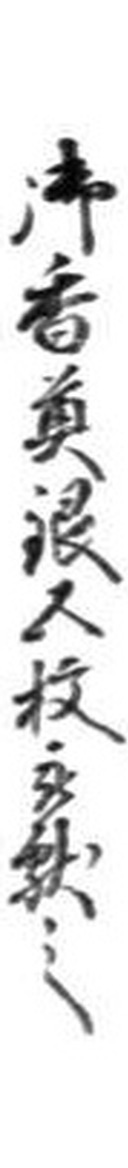御香奠銀五枚被献之
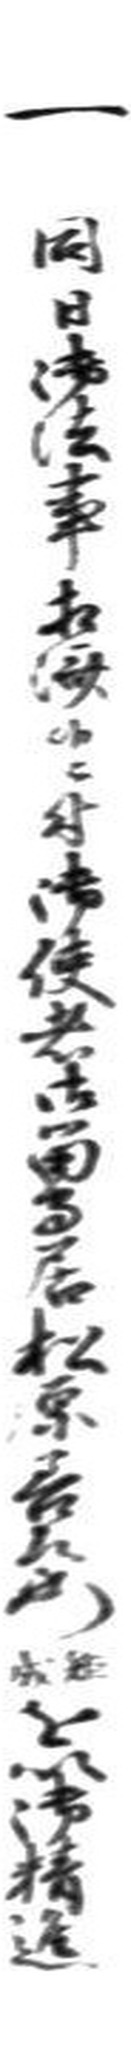一同日御法事相済候ニ付御使者御留守居松原善左衛門矩成を以御精進
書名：家譜 二十一 吉品公 従元禄十三年到同十四年
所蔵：福井県文書館 Fukui Prefectural Archives
